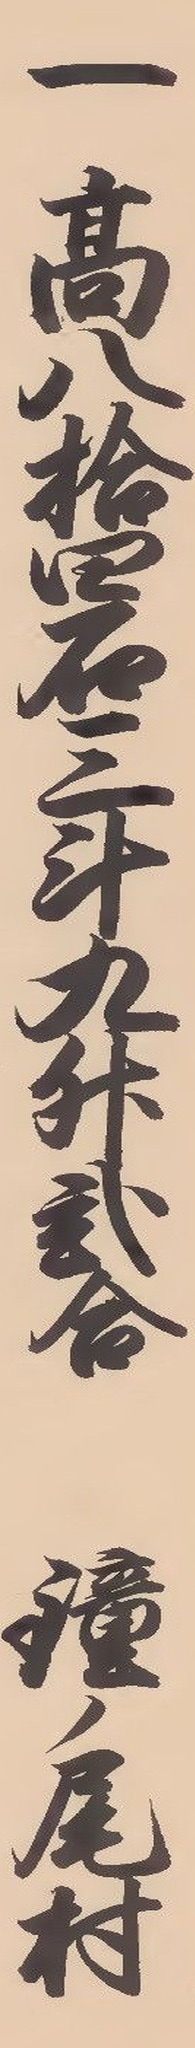一高八拾四石三斗九升弐合鐘ノ尾村
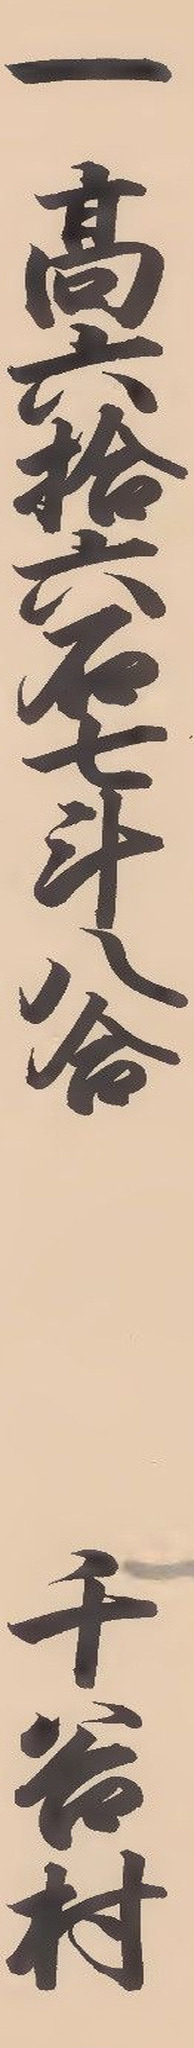一高六拾六石七斗八合千谷村
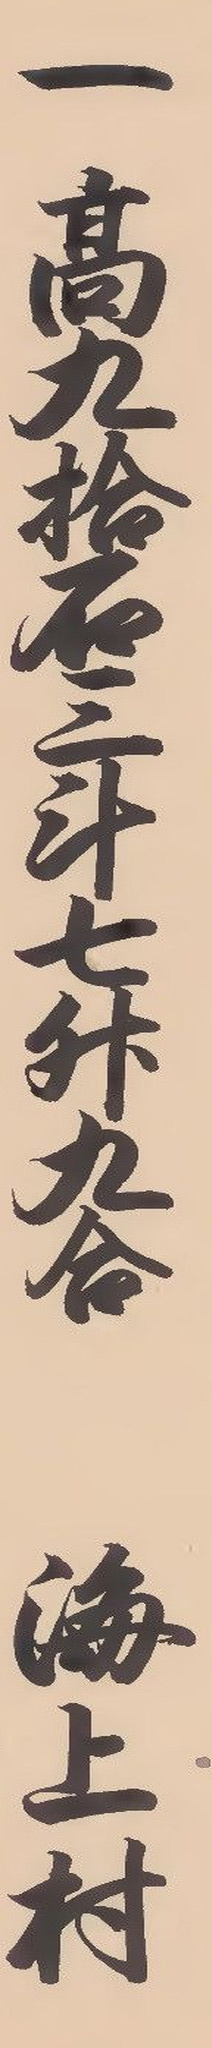一高九拾石三斗七升九合海上村
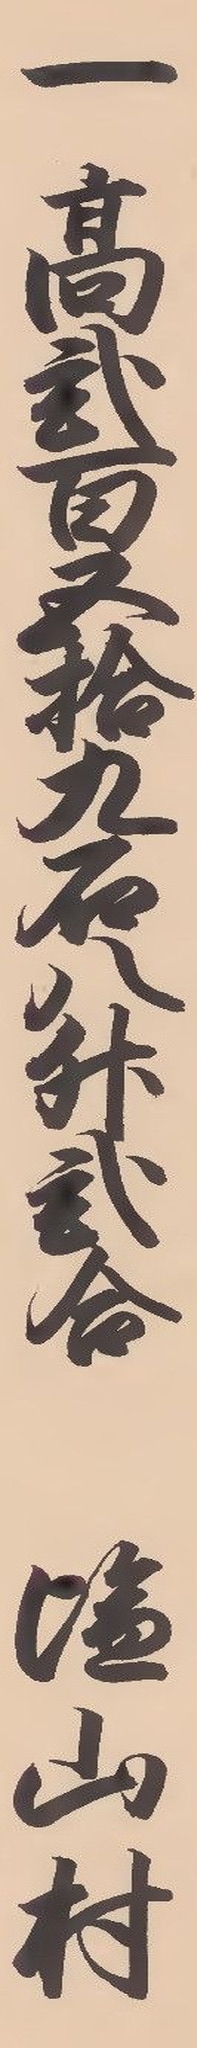一高弐百五拾九石八升弐合塩山村
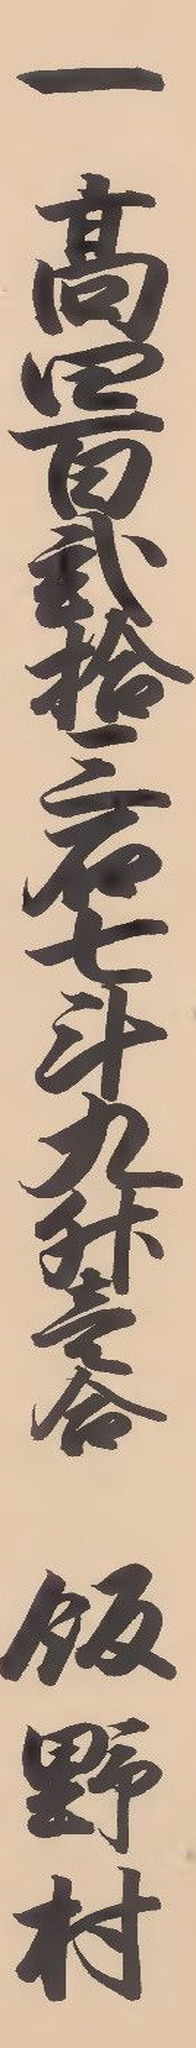一高四百弐拾三石七斗九升壱合飯野村
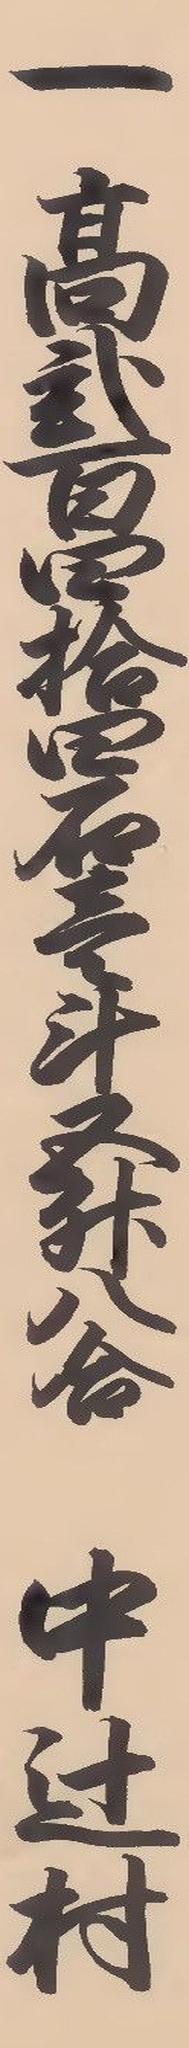一高弐百四拾四石壱斗五升八合中辻村
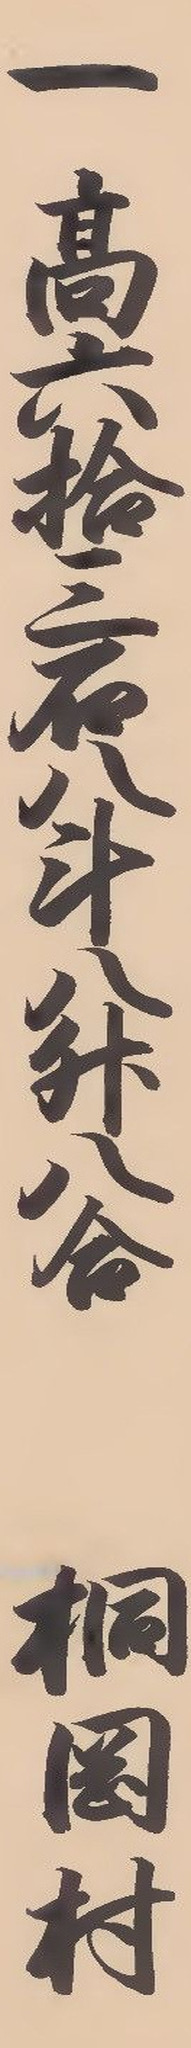一高六拾三石八斗八升八合桐岡村
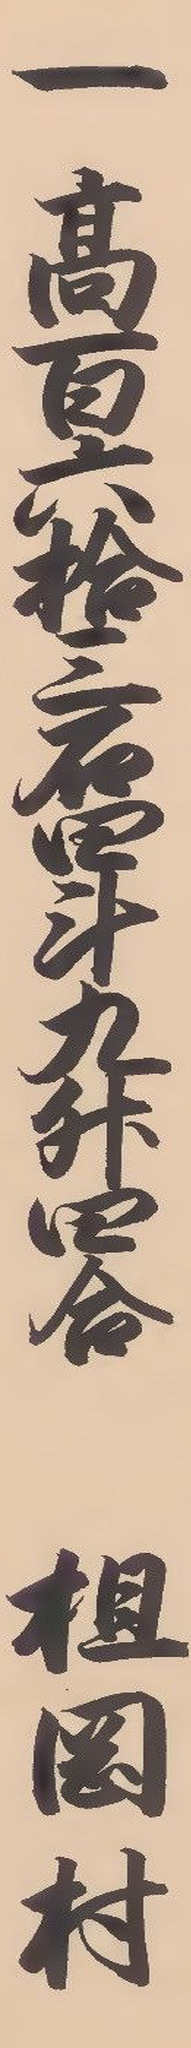一高百六拾三石四斗九升四合柦岡村

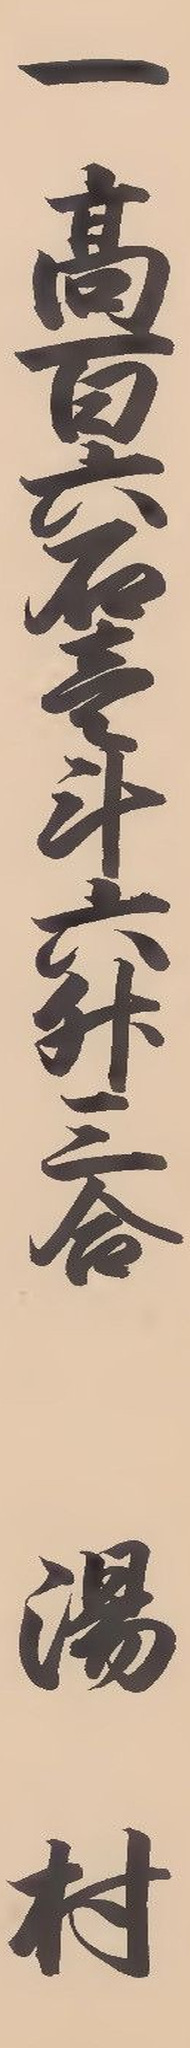一高百六石壱斗六升三合湯村
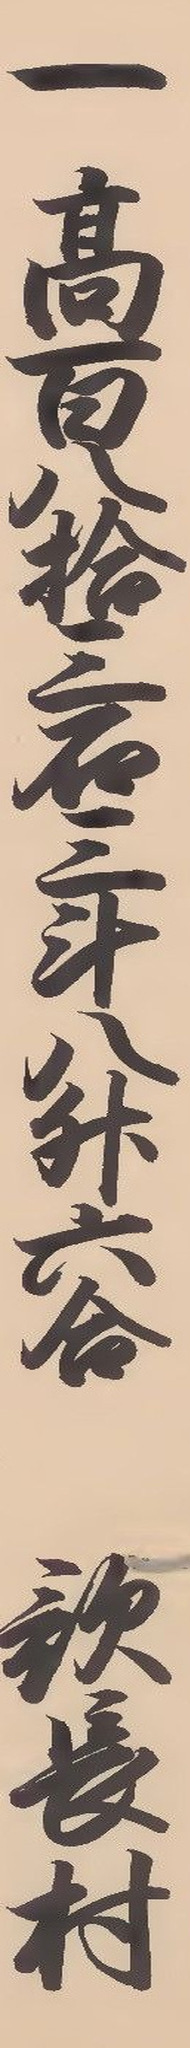一高百八拾三石三斗八升六合歌長村
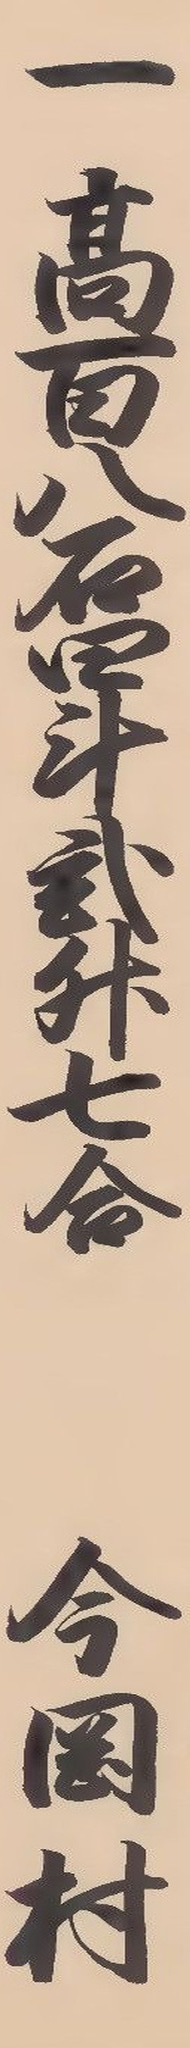一高百八石四斗弐升七合今岡村
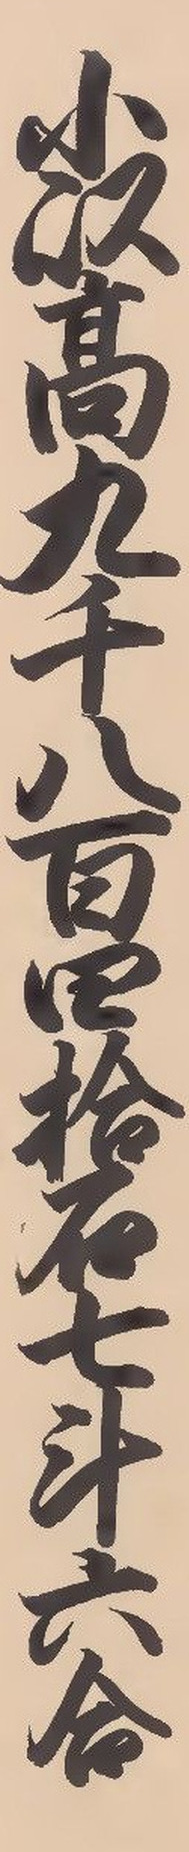小以高九千八百四拾石七斗六合

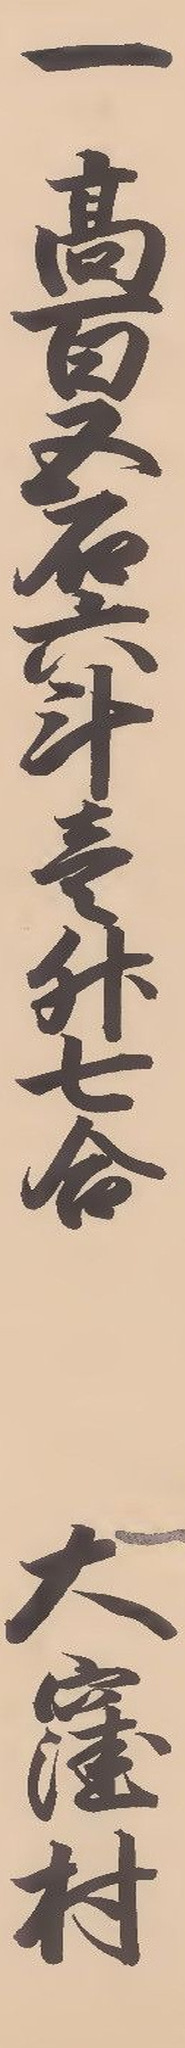一高百五石六斗壱升七合大窪村
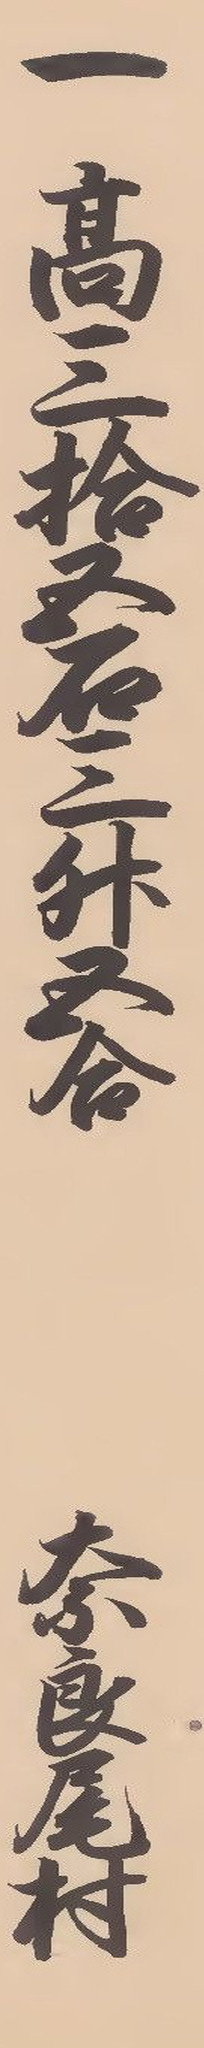一高三拾五石三升五合奈良尾村
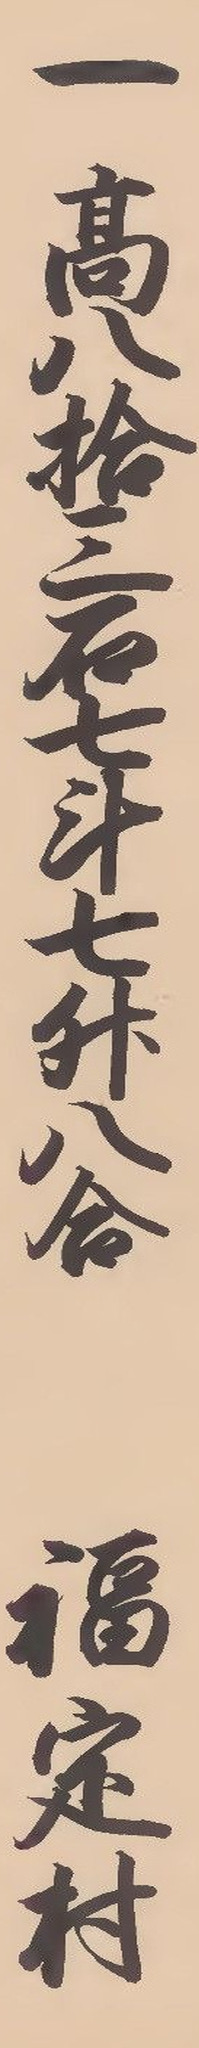一高八拾三石七斗七升八合福定村
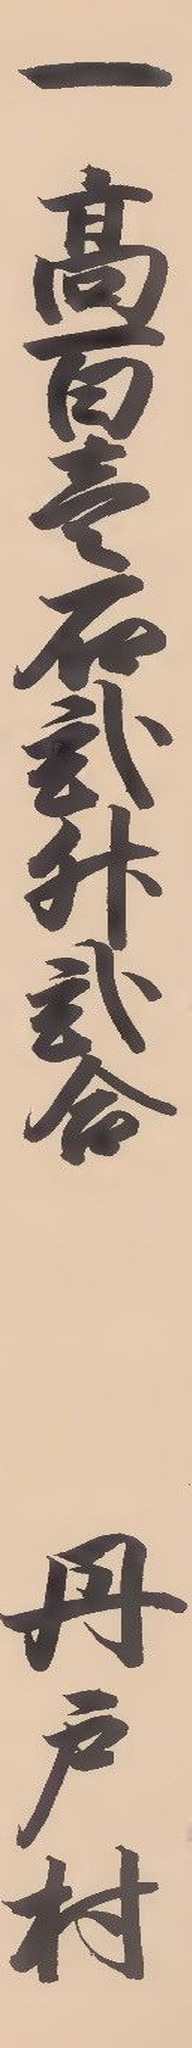一高百壱石弐升弐合丹戸村
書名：但馬国郷帳
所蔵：国立公文書館 National Archives of Japan
